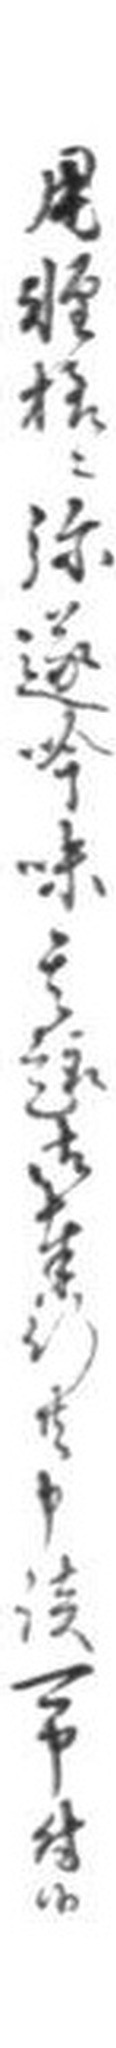用軽様ニ弥遂吟味其趣御奉行共申談可申付候
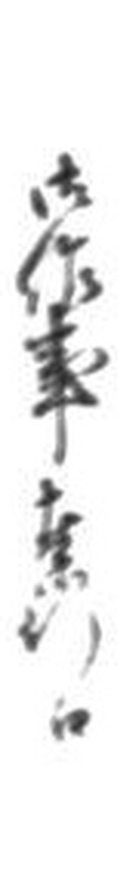御作事奉行江
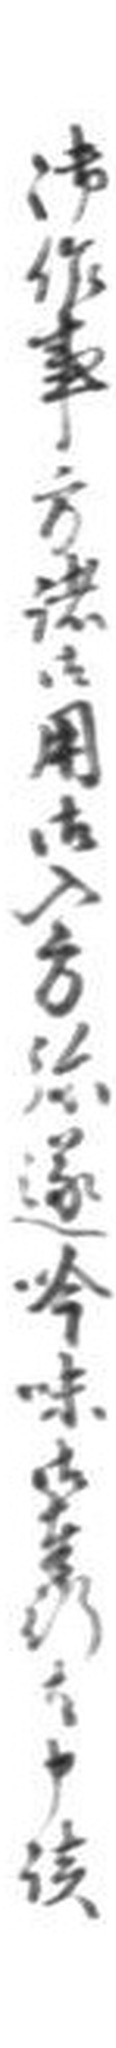御作事方諸御用御入方弥遂吟味御奉行共申談
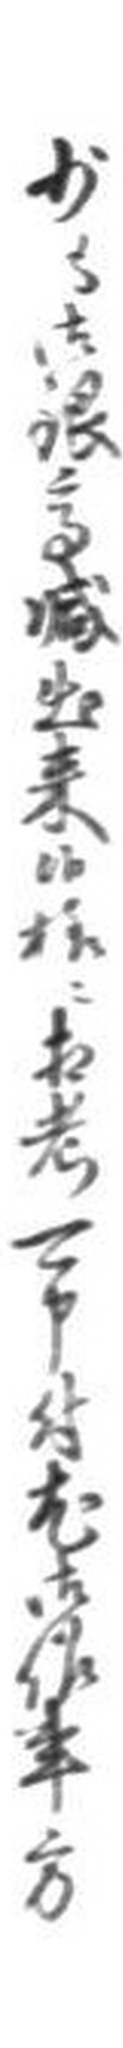少も御銀高減出来候様ニ相考可申付尤御作事方
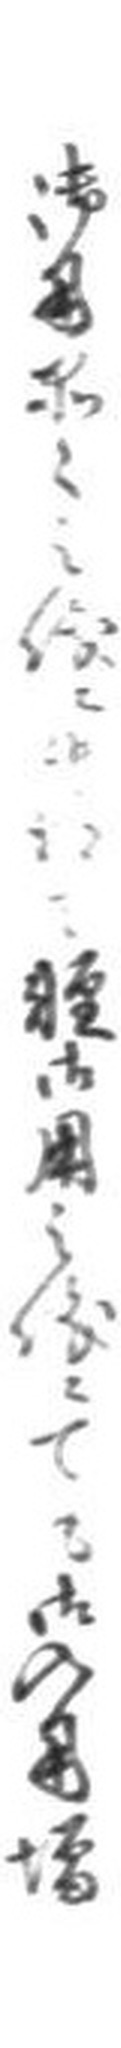御用品々之儀ニ候得者軽御用之儀ニても御入用増
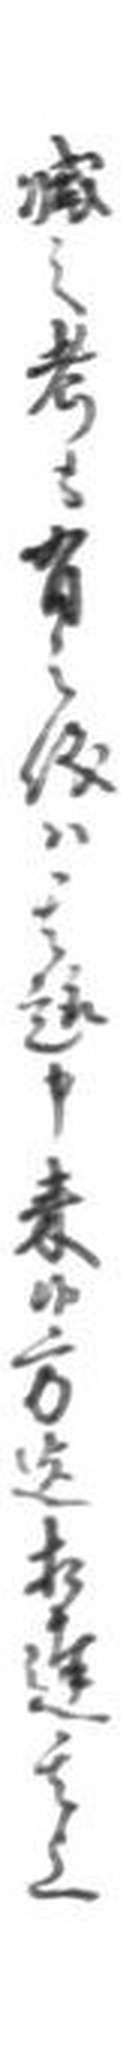減之考も有之儀ハ其趣申来候方迄相達其上
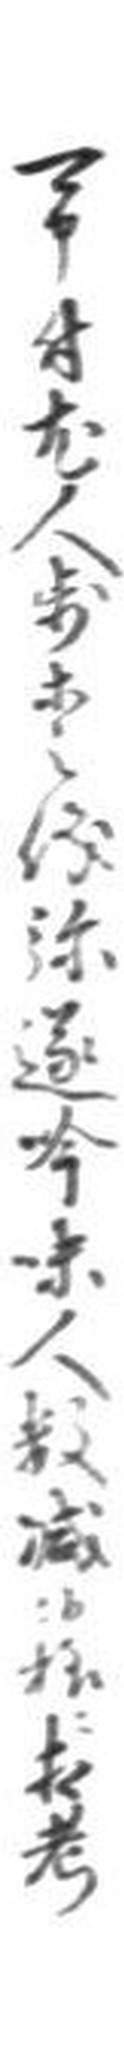可申付尤人歩等之儀弥遂吟味人数減候様ニ相考
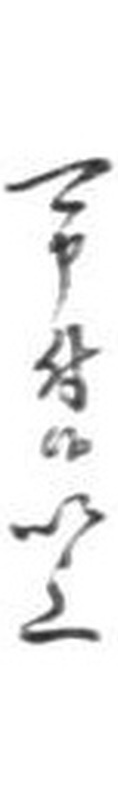可申付候以上

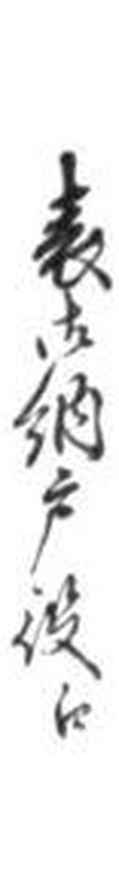表御納戸役江
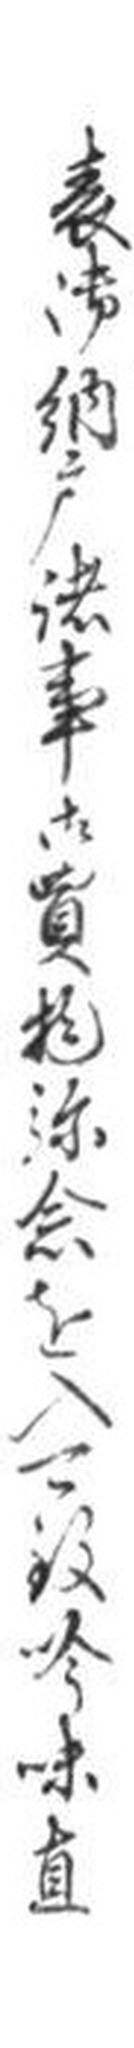表御納戸諸事御買物弥念を入可致吟味直
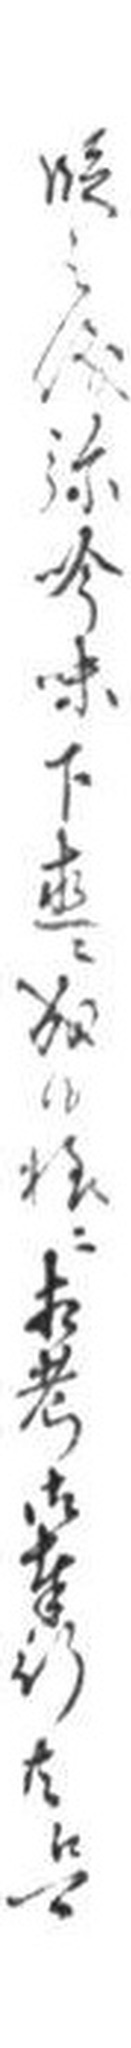段之儀弥吟味下直ニ成候様ニ相考御奉行共江可
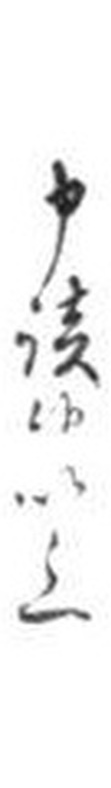申談候以上
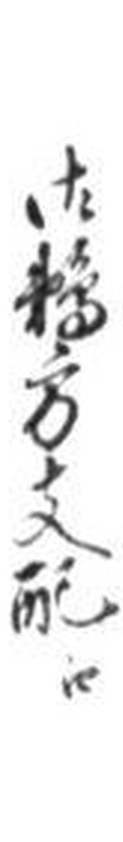御鵜方支配江
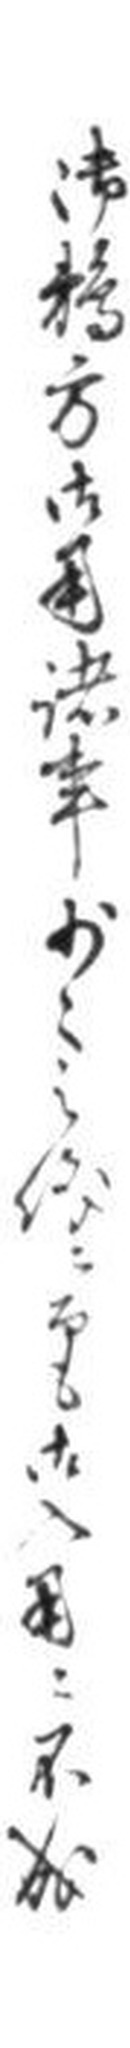御鵜方御用諸事少々之儀ニ而も御入用ニ不成
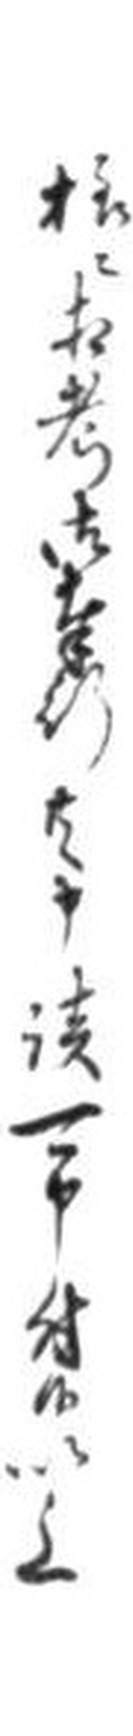様ニ相考御奉行共申談可申付候以上
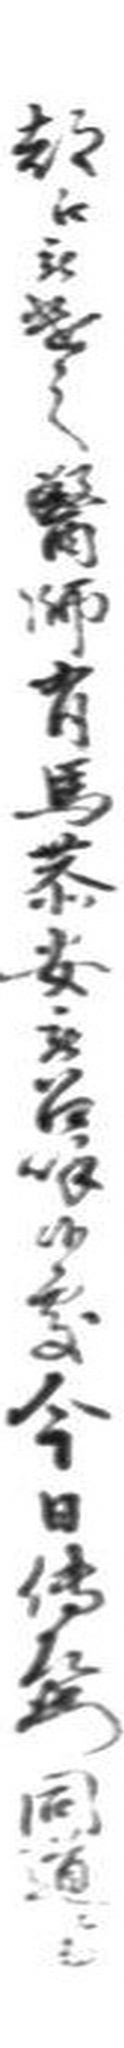都江被遣之医師有馬恭安被召呼候処今日伝左衛門同道ニ而
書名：家譜 二十二 吉品公 従元禄十五年到同十六年
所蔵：福井県文書館 Fukui Prefectural Archives
